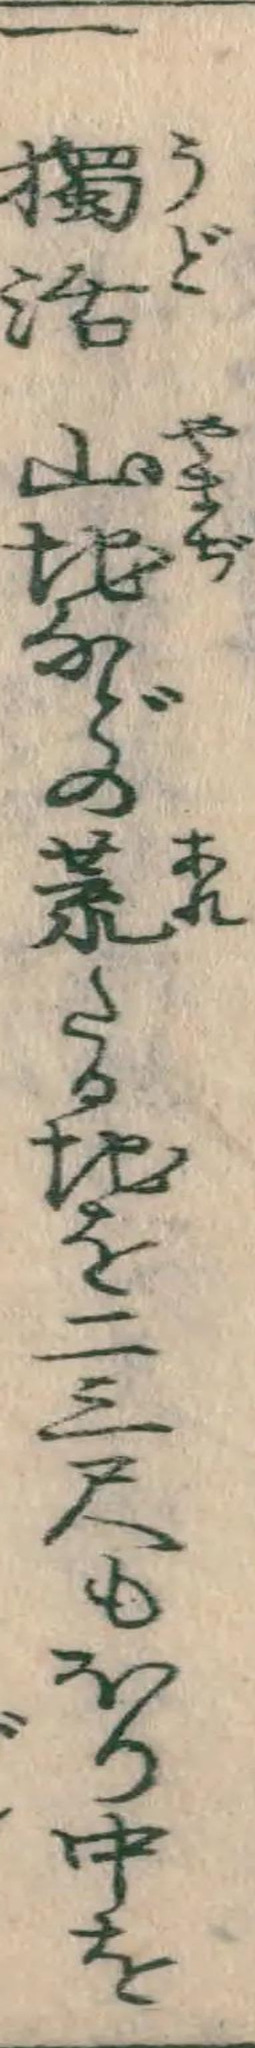一独活山地などの荒たる地を二三尺もほり中を
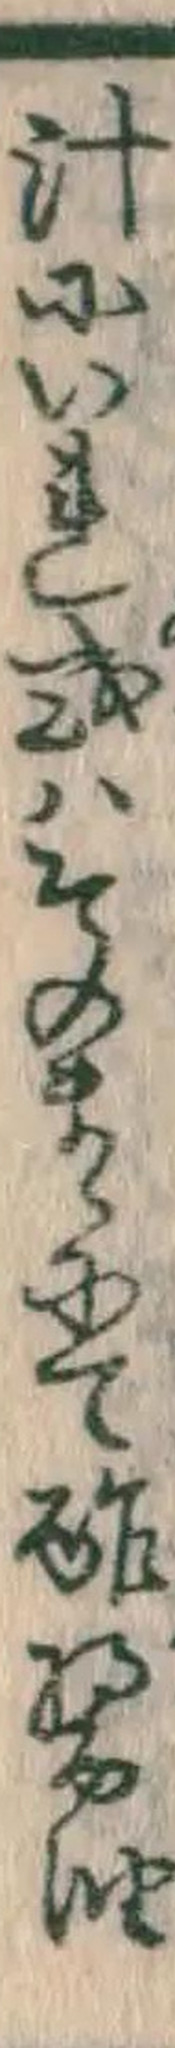汁にいれ或はそのまゝにて酢醬油
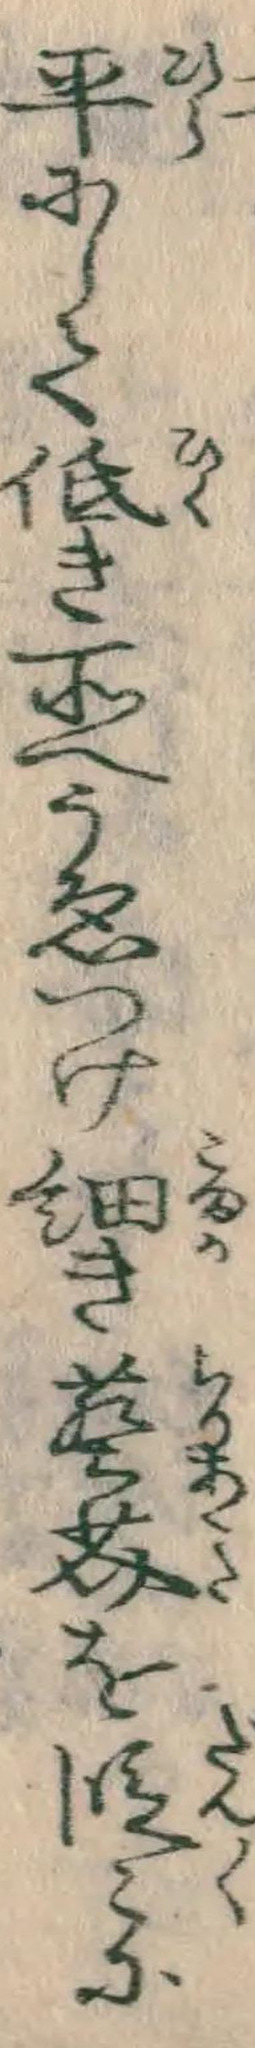平にして低き所へうゑつけ細き塵芥を段々に
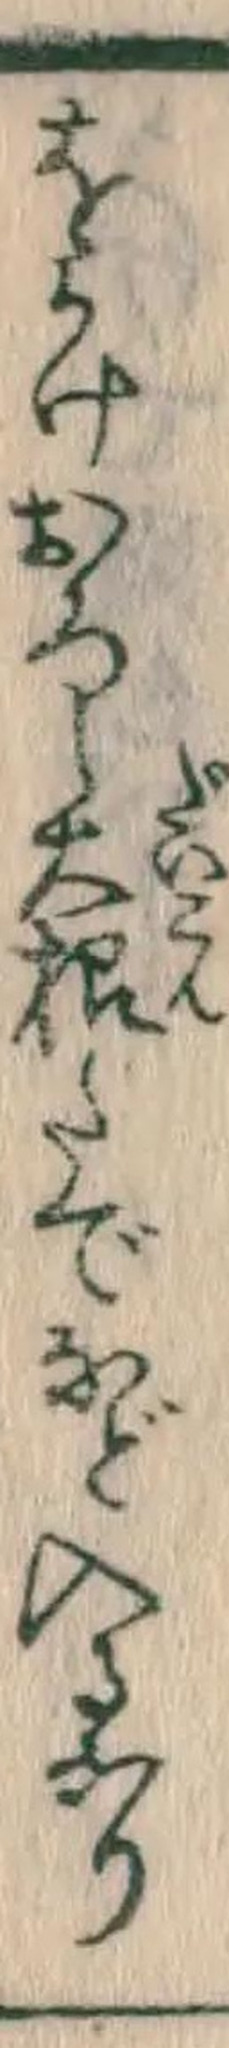をかけおろし大根たでなど入るなり
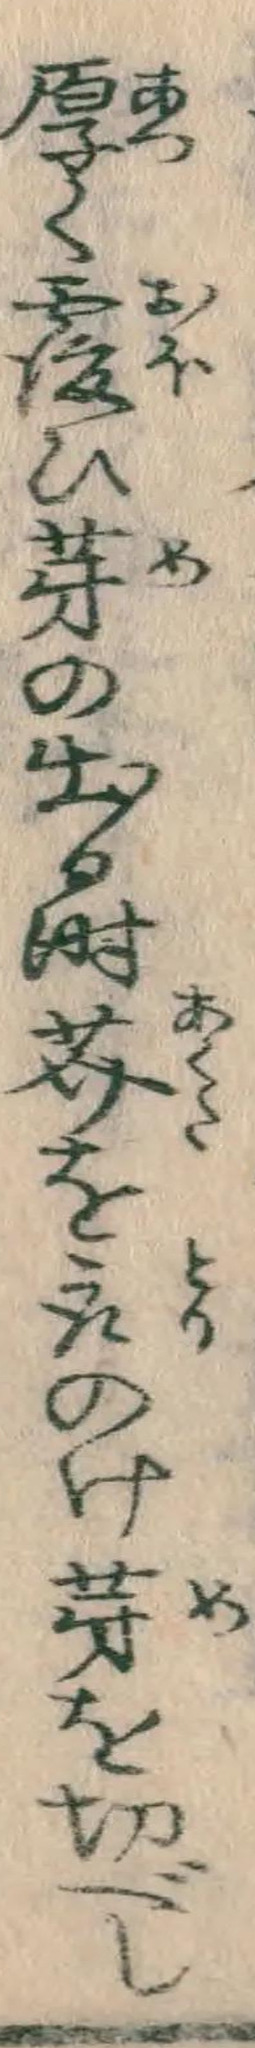厚く覆ひ芽の出る時芥を取のけ芽を切べし
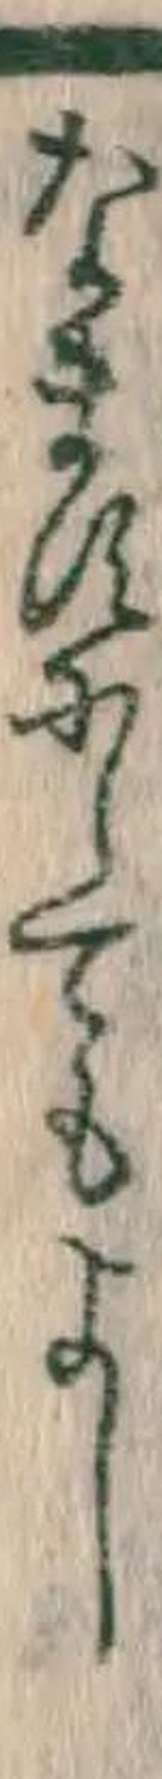なますにしてもよし
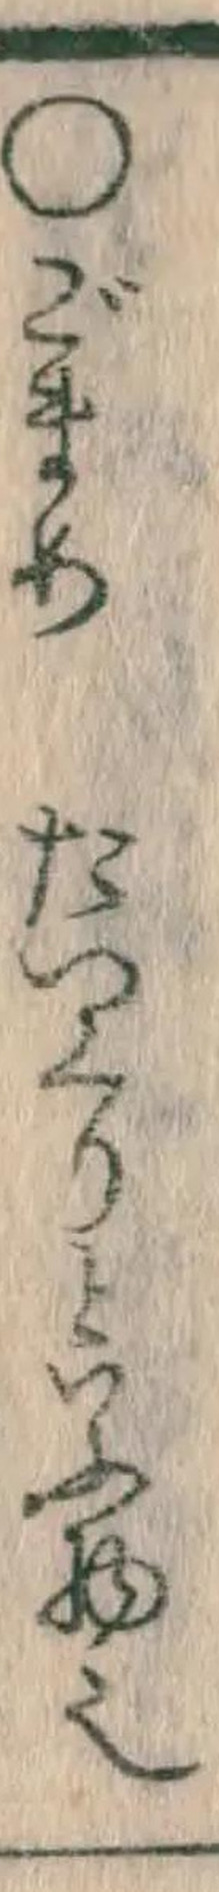○ごまめたつくりといふ物なり
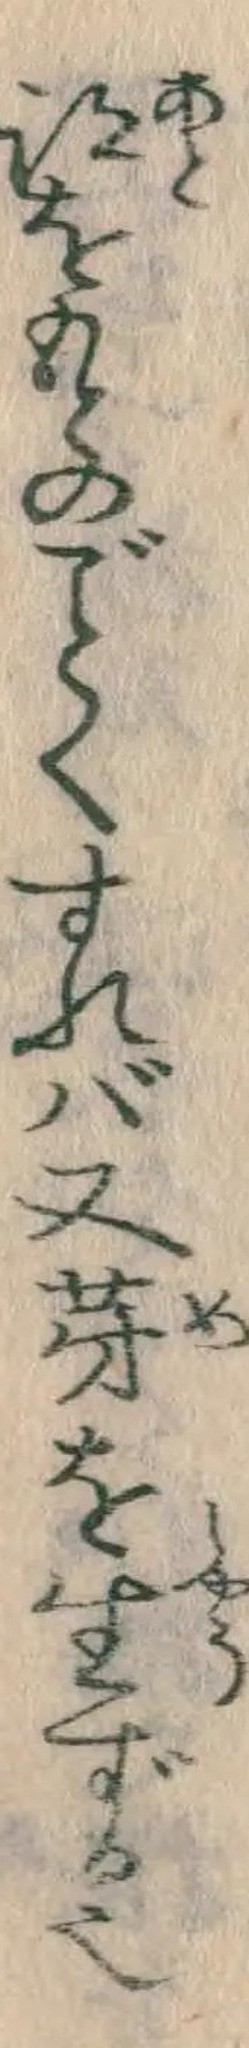跡をもとのごとくすれば又芽を生ずる也
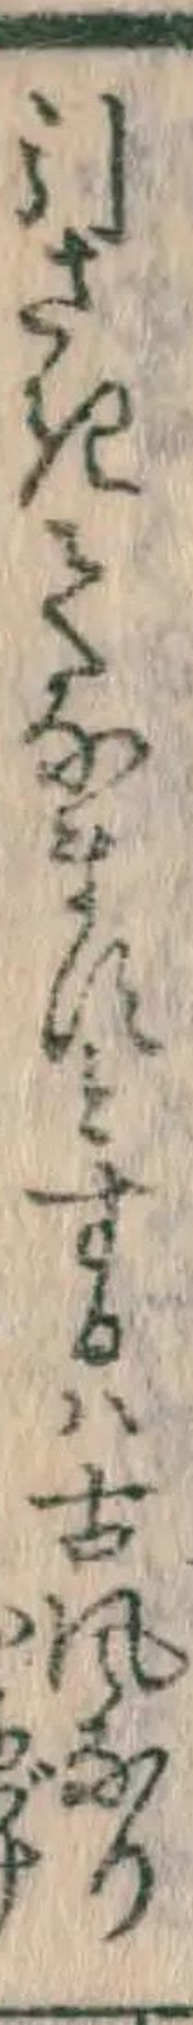引さきてなますとするは古風なり
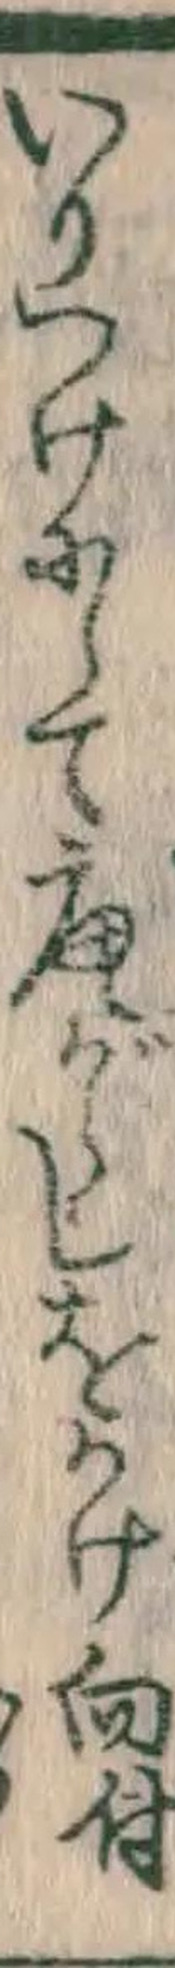いりつけにして唐がらしをかけ向付
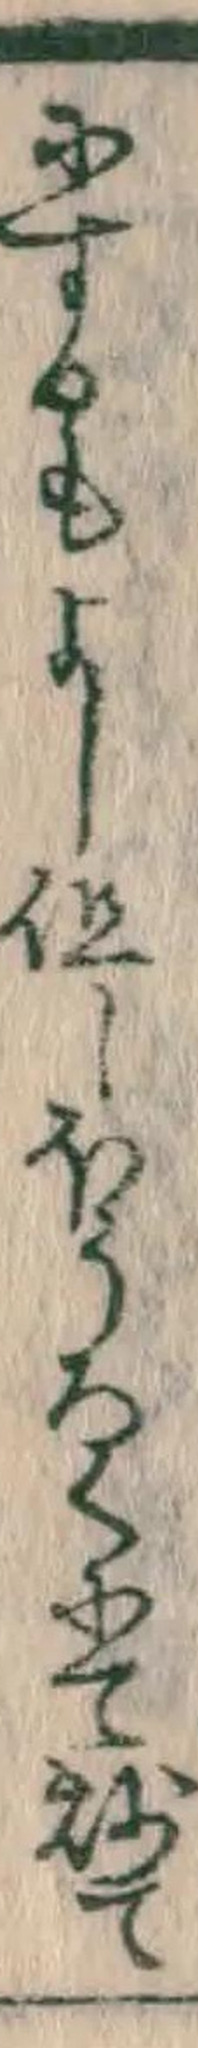にするもよし但しほうろくにて炒て
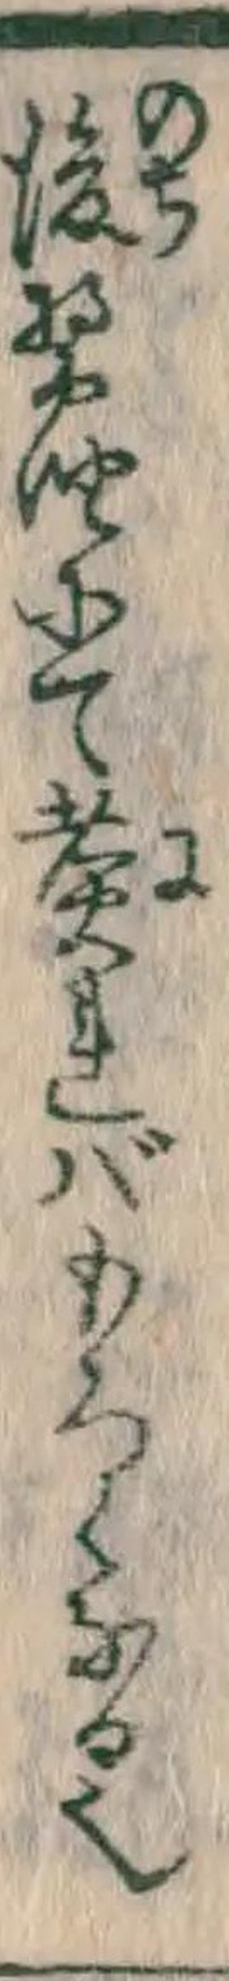後醬油にて煮ればもろくなる也
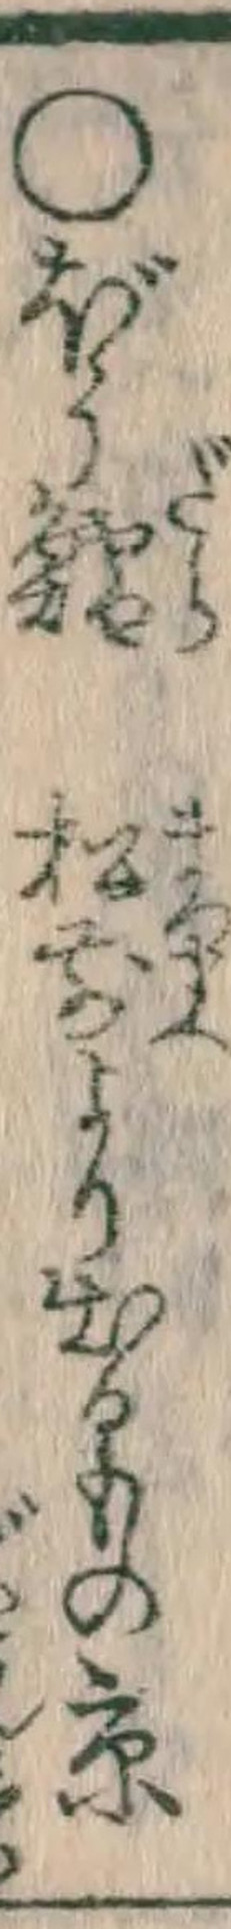○ぼう鱈松前より出るもの京
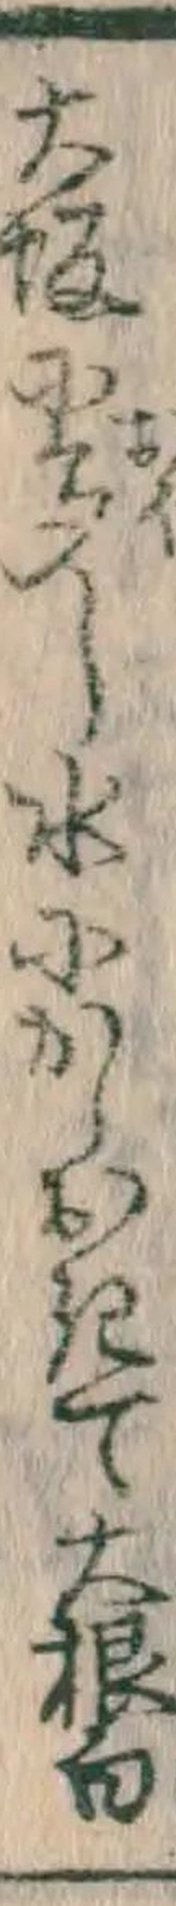大坂に多し水にかしおきて大根白
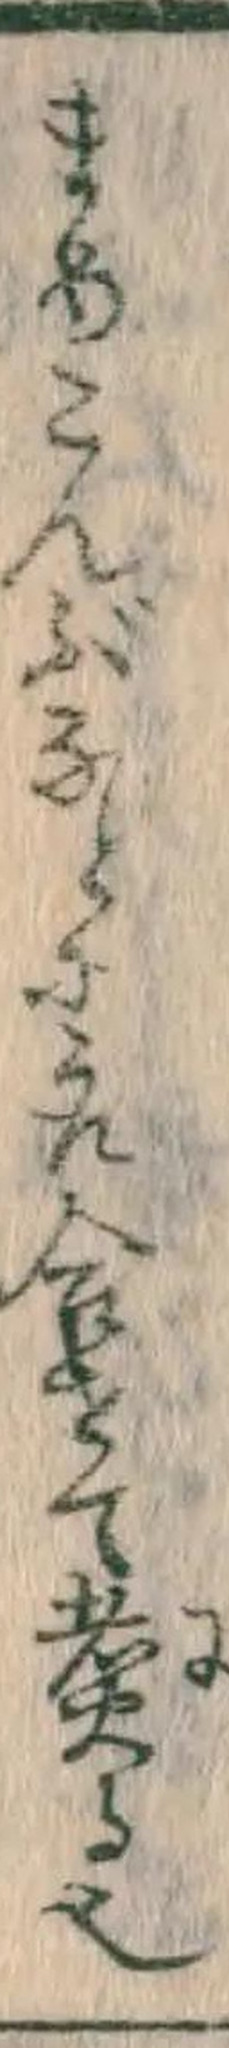まめこんぶなとに取合せて煮る也
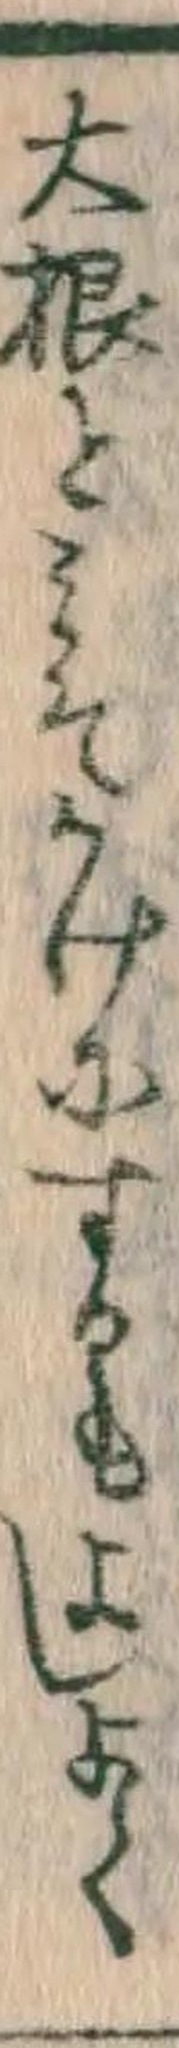大根とみそ汁にするもよしよく
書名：広益秘事大全 3巻. [5]
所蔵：国立国会図書館 National Diet Library, JAPAN
